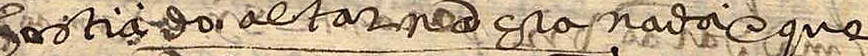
hostia do altar nā Era nada e que
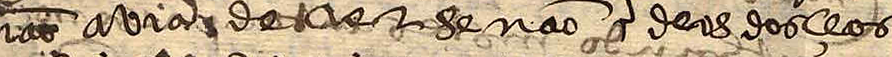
não avia de crer senão ē deos dos çeos
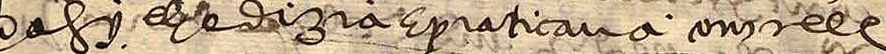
e asy lhe dizia E praticaua com elle
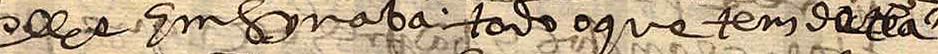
e lhe Emsynava todo o que tem decla
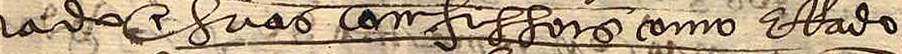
rado ē suas comfissoes como ERado
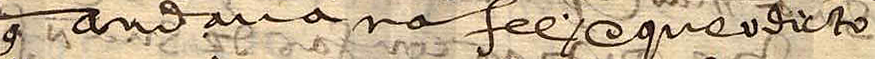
q̄ andaua na fee. / e que o dict̄o
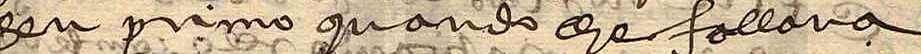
seu primo quando lhe fallaua
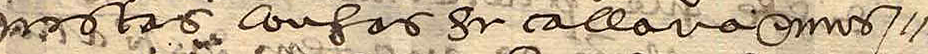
nestas cousas se callaua e mos //
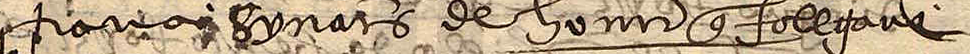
traua synaēs de homē q̄ follgaua
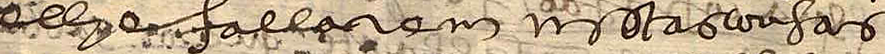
de lhe fallarem nestas cousas
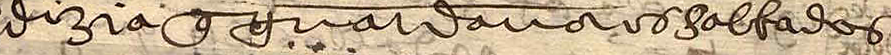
e dizia q̄ guardaua os sabbados
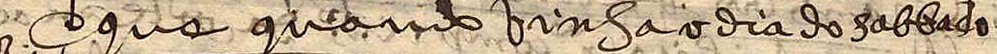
e que quando vinha o dia do sabbado
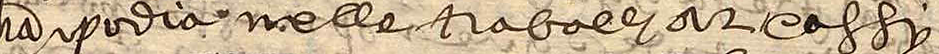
nā podia nelle trabalhar / e assy
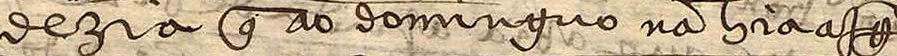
dezia q̄ ao dominguo nā hia a Jḡra
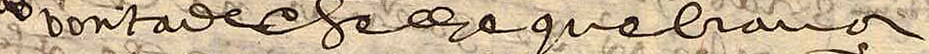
p̄o vontade e se lhe quebraua
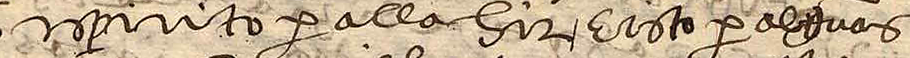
o espirito ꝑa lla hir / E isto ꝑ algūas
